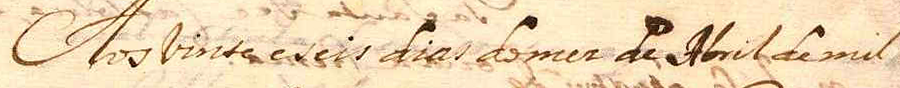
Aos vinte e seis dias do mez de Abril de mil
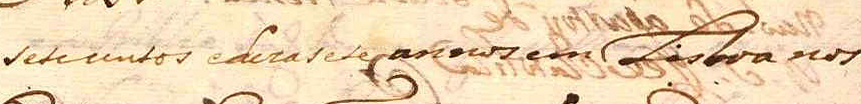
setecentos e dezasete annos em Lisboa nos
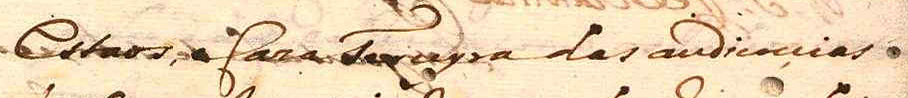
Estaos, e Caza Terceyra das audiencias
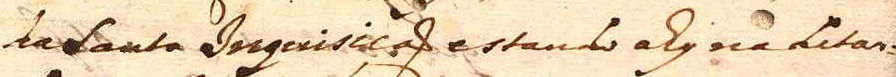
da Santa Inquisiçaõ estando ahy na de tar
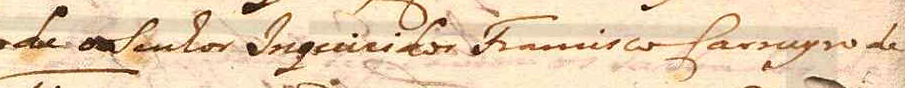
de o Senhor Inquizidor Francisco Carneyro de
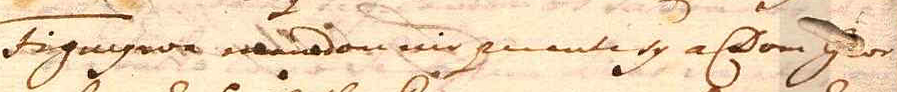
Figueyroa mandou uir perante sy a Dom G_or
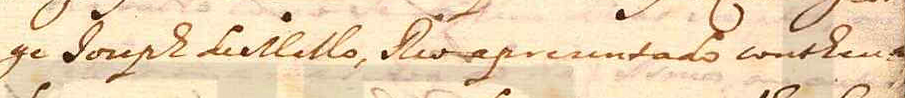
ge Iozeph de Mello, Reo aprezentado contheu
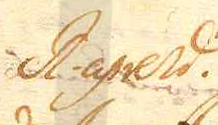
R aprezdo.
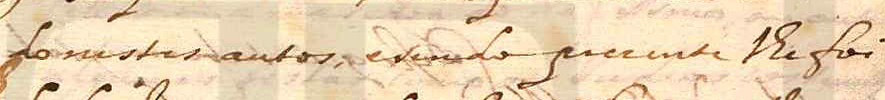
do nestes autos, e sendo prezente lhe foi
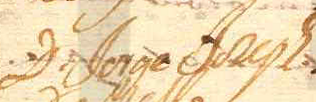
D. Jorge Iozeph.
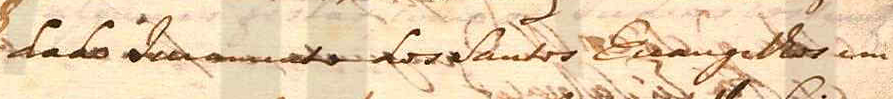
dado Iuramento dos Santos Euangelhos em
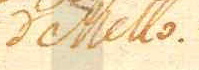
d̄ Mello.
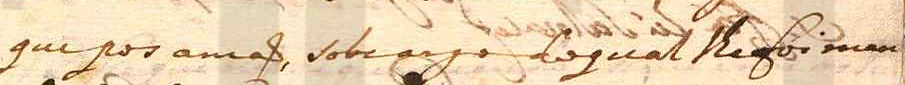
que pos a maõ, sob cargo do qual lhe foi man
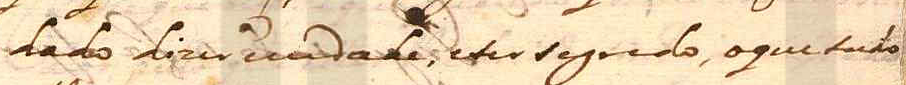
dado dizer uerdade, e ter segredo, o que tudo
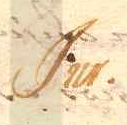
Iur.
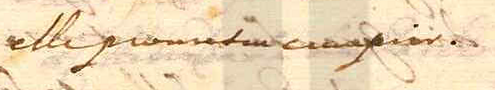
elle prometeu cumprir.
